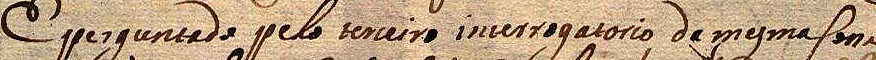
E perguntado pelo terceiro interrogatorio da mesma Com
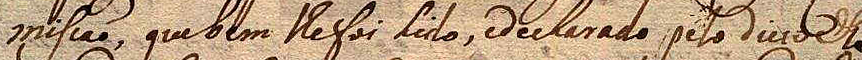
missaõ, que bem lhe foi Lido, e decLarado pelo dicto Re
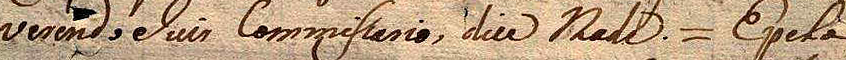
verendo Iuiz Commissario, dice Nada. = E peLo
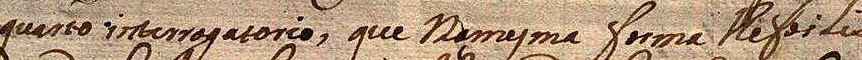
quarto interrogatorio, que Na mesma forma lhe foi Li
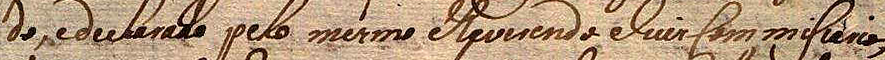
do, e decLarado pelo mesmo Reverendo Iuiz Commissario,
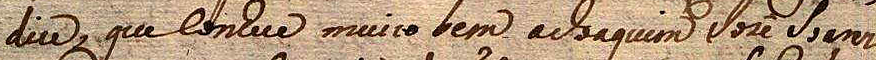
dice, que conhece muito bem o Ioaquim Iozé Soarez
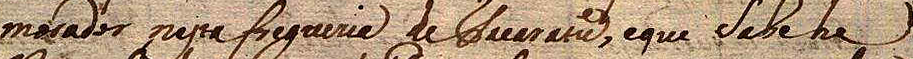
morador nesta freguezia de Tacaratú, e que Sabe he
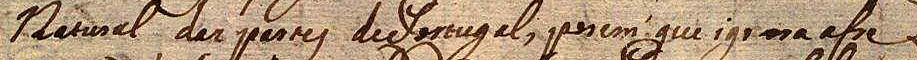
Natural daz partes de Portugal, porem que ignora a fre
